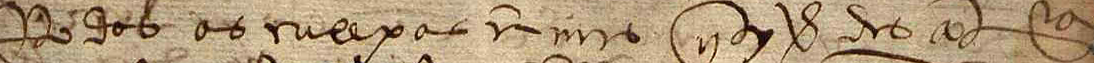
E todas as cullpas c̄mes q̄ tyꝟdes c̄otra
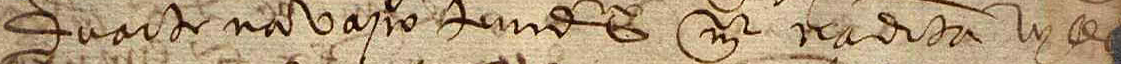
duarte navaro temdro mor na dita vyll
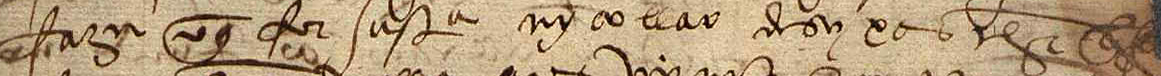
fazer o q̄ for Justa nycollao de seyxas c̄hr q̄ ho
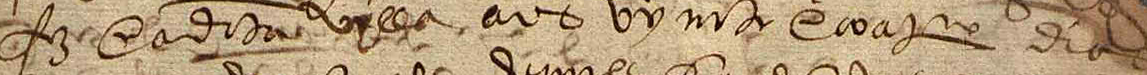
fiz ē a dita vylla aos vymte e coatro dias
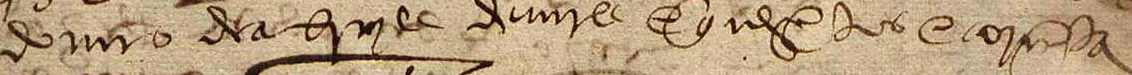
do mes de abryll de mjll e q̄nhētos e corēta
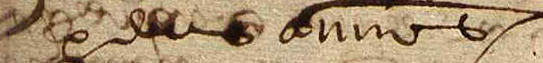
e dous annos /
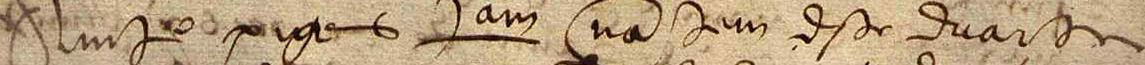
Amto piges tam nā tem deste duarte
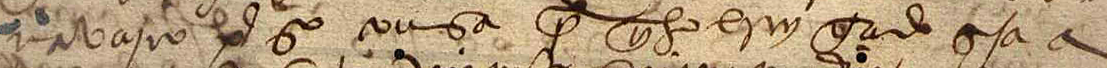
navaro p̄so cousa p̄o q̄ hobrygado seJa a
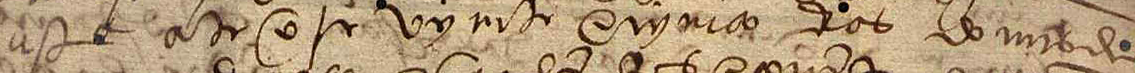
Justa ate oje vymte e cymco dias do mes de
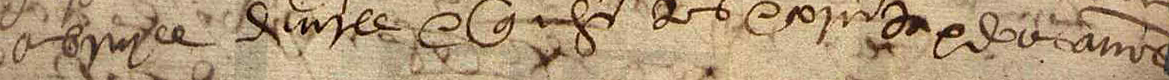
abryll de mjll e q̄nhētos e corēta e dous annos
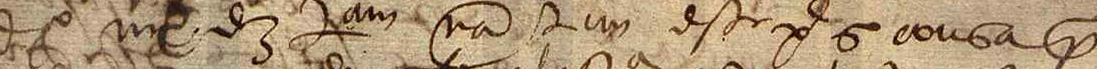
djo mēdez tam nā tem deste p̄so cousa p̄o
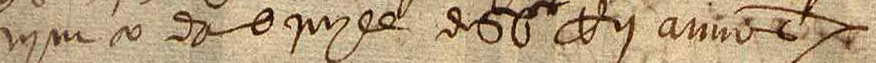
cymco dabryll de j̄bc Rij annos /
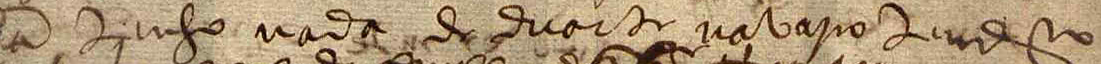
nā tenho nada de duarte navaro tendro
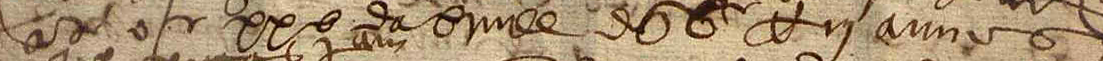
ate oJe xxb dabryll de j̄bc Rij annos
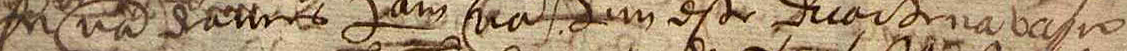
fernā deannes tam nā tem deste duarte navaro
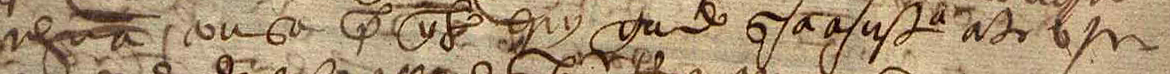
nhūa cousa p̄o q̄ hobrygado seJa a Justa ate oJe
